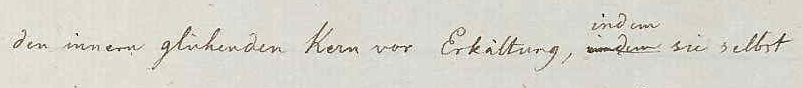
den innern glühenden Kern vor Erkältung, demindem sie selbst
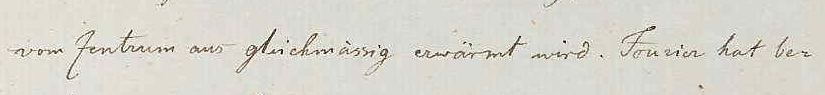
vom Zentrum aus gleichmässig erwärmt wird. Fourier hat be-
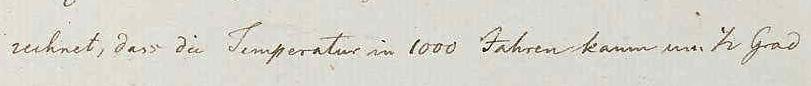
rechnet, dass die Temperatur in 1000 Jahren kaum um ½ Grad
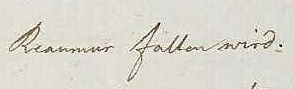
Reaumur fallen wird.
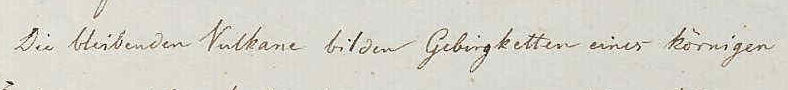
Die bleibenden Vulkane bilden Gebirgketten eines körnigen
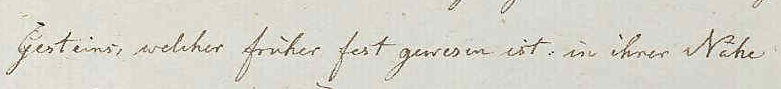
Gesteins, früher fest gewesen ist: in ihrer Nähe
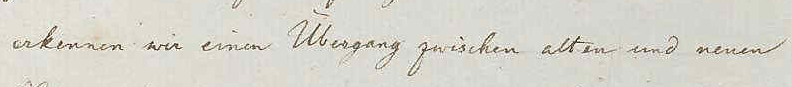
erkennen wir einen Übergang zwischen alten und neuen
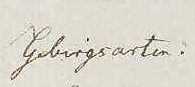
Gebirgsarten.
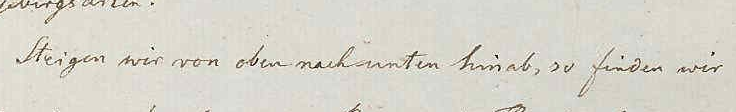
Steigen wir von oben nach unten hinab, so finden wir
